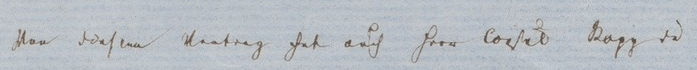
Von diesem Vertrag hat auch Herr Consil Rapp in
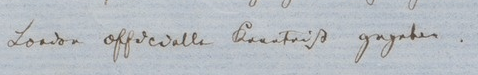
London officielle Kenntniß gegeben.
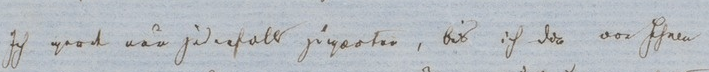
Ich werde nun jedenfalls zuwarten, bis ich die von Ihnen
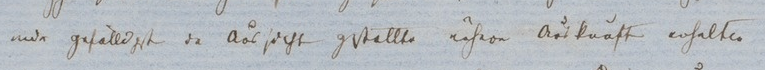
mir gefälligst in Aussicht gestellte nähere Auskunft erhalten
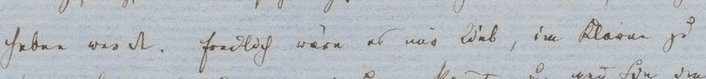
haben werde. Freilich wäre es mir lieb, im Klaren zu
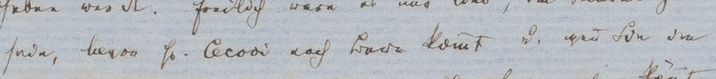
sein, bevor H. Cecovi nach Bern kommt u. wenn Sie im
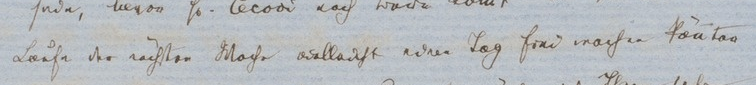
Laufe der nächsten Woche vielleicht einen Tag frei machen könnten
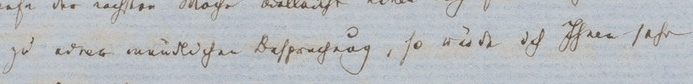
zu einer mündlichen Besprechung, so würde ich Ihnen sehr
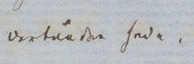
verbunden sein.
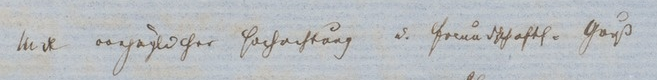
Mit vorzüglicher Hochachtung u. freundschaftl. Gruß
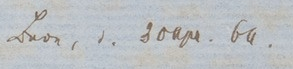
Bern, d. 30 Apr. 64
